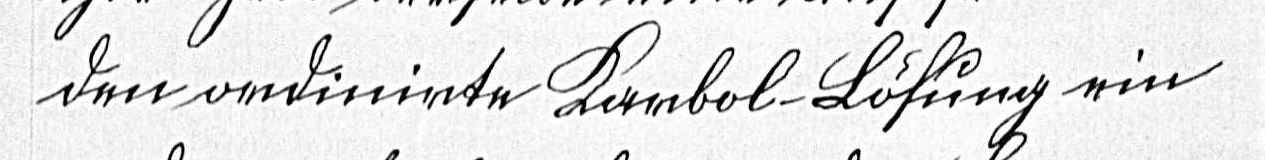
den ordinirte Karbol-Lösung ein
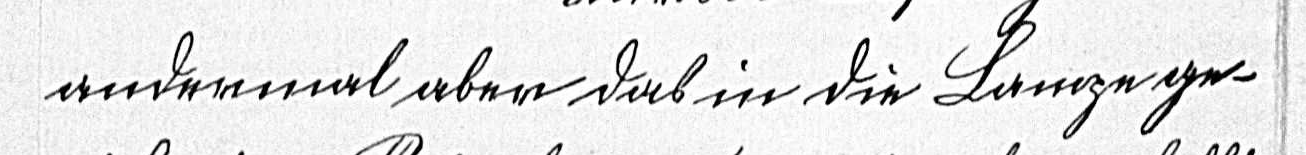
andermal aber das in die Lampe ge¬
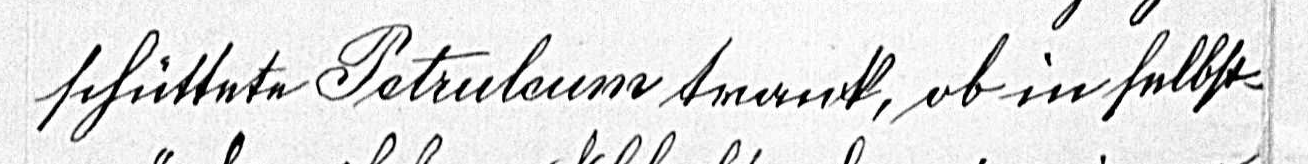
schüttete Petruleum trank, ob in selbst¬
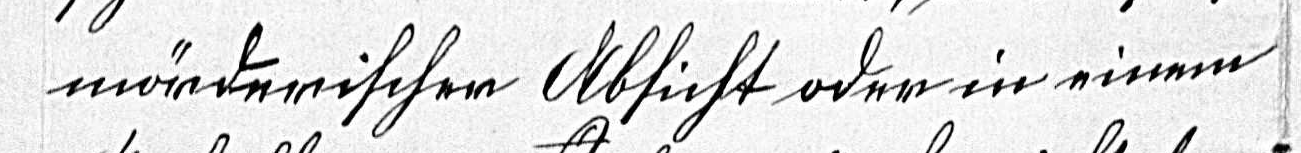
mörderischen Absicht oder in einem
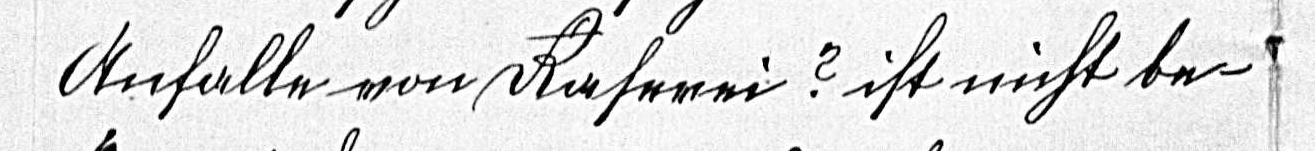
Anfallte von Raserei? ist nicht be¬
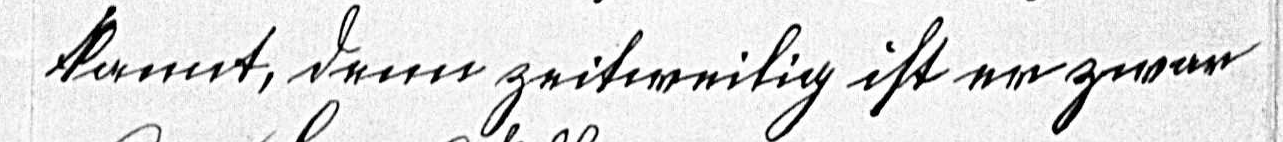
kannt, denn zeitweilig ist er zwar
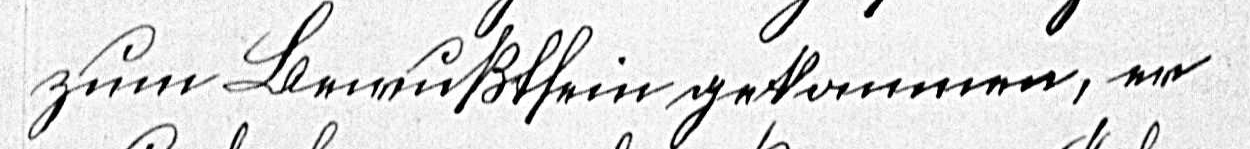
zum Bewußtsein gekommen, er
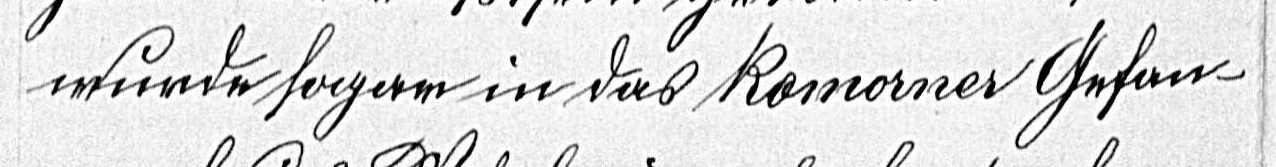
wurde sogar in das Komorner Gefan¬
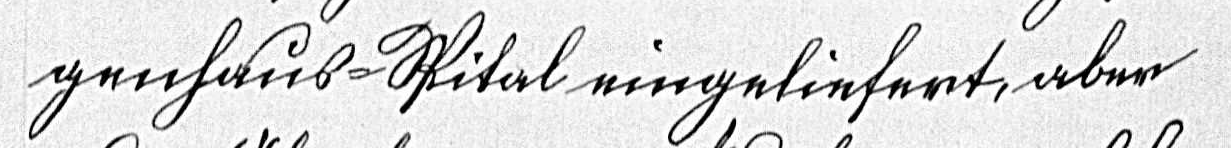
genhaus-Spital eingeliefert, aber
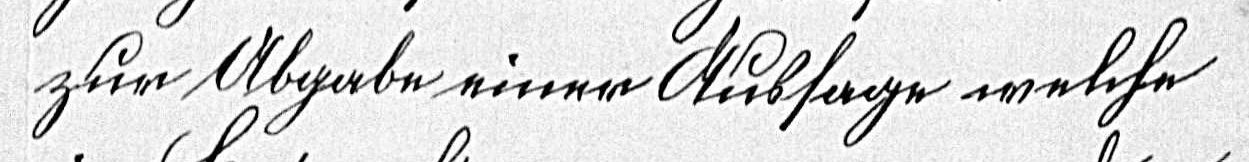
zur Abgabe einer Aussage welche
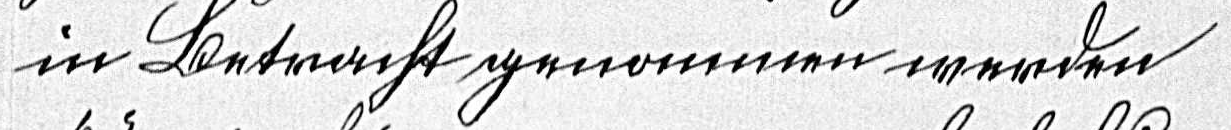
in Betracht genommen warden
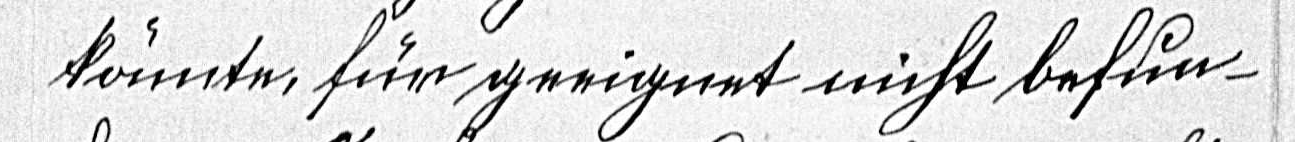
könnte, für geeignet nicht befun¬
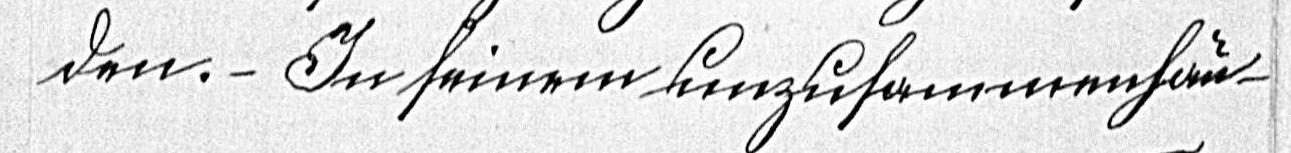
den. In seinem unzusammenhän¬
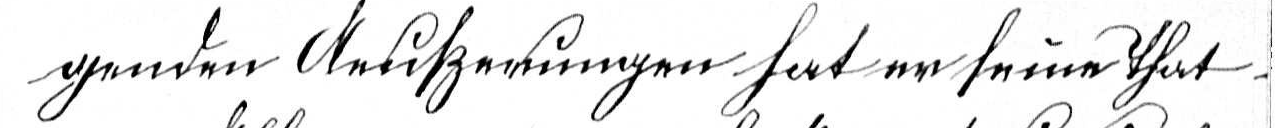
genden Aeußerungen hat er seine That
